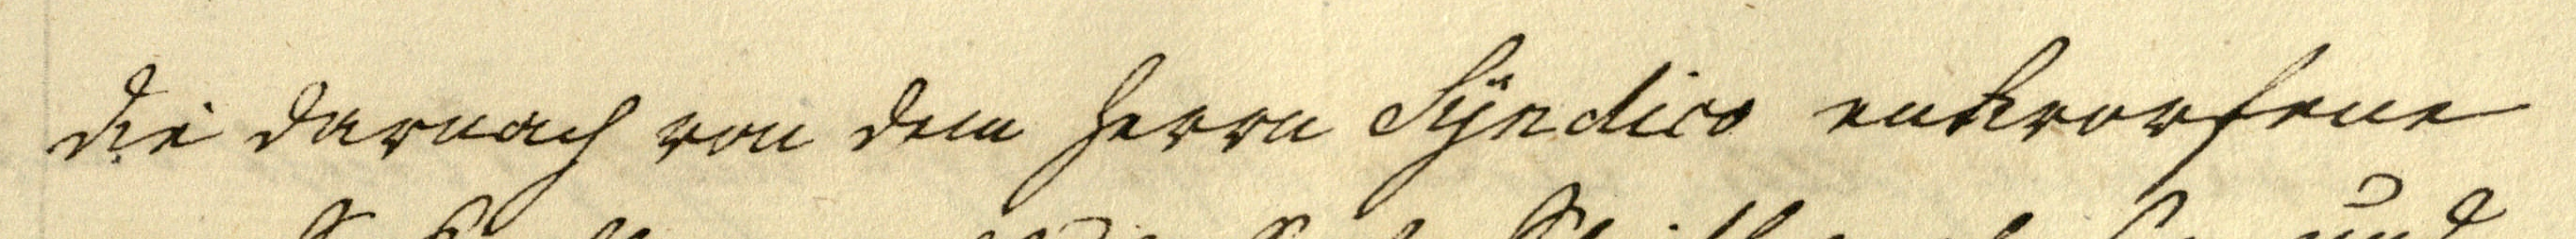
die darnach von dem herrn Syndico entworfene
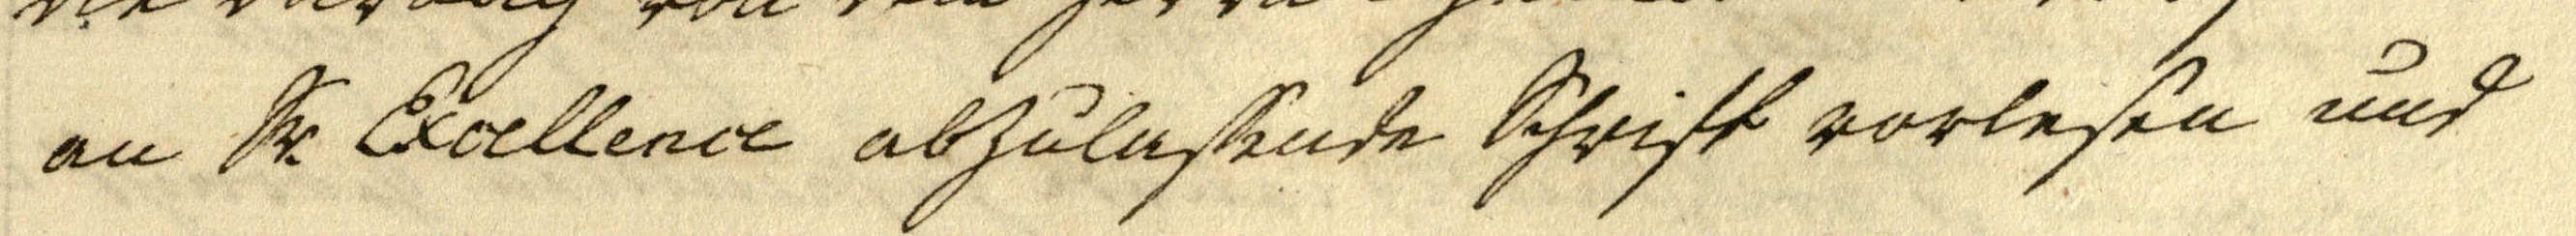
an Sr. Excellence abzulassende Schrift vorlesen und
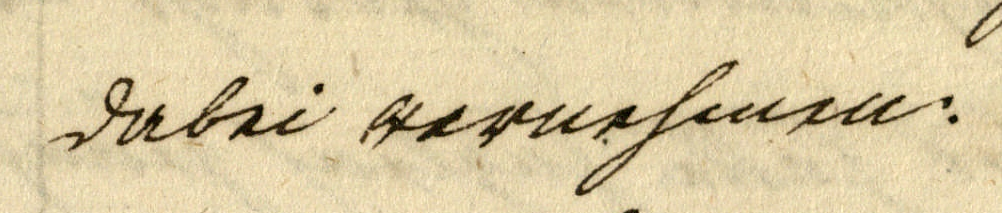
dabei vernehmen:
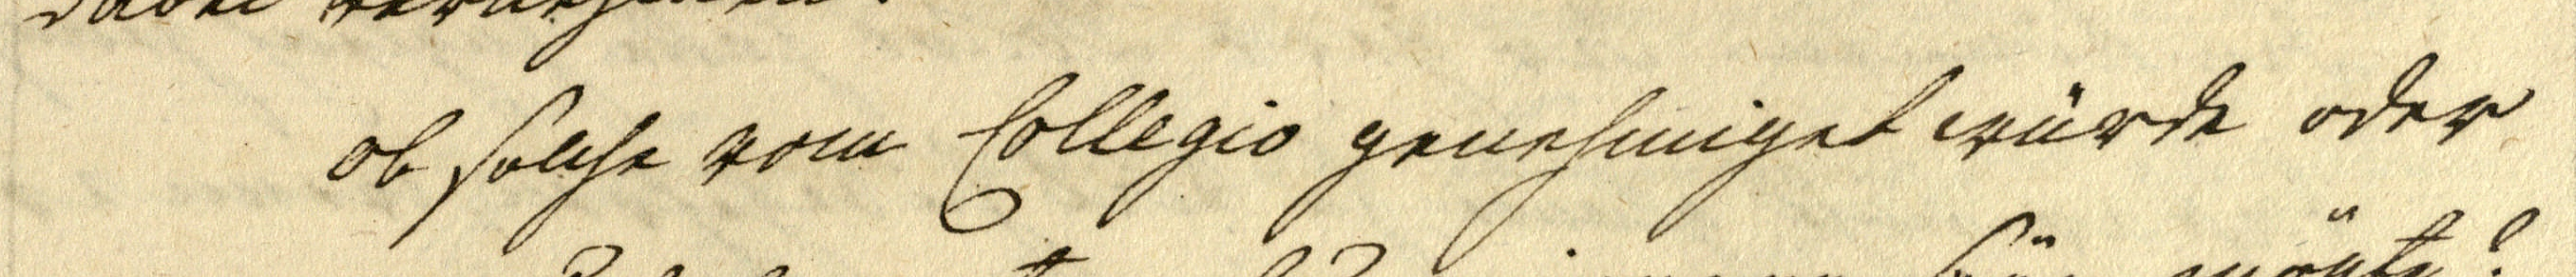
ob solche vom Collegio genehmiget würde oder
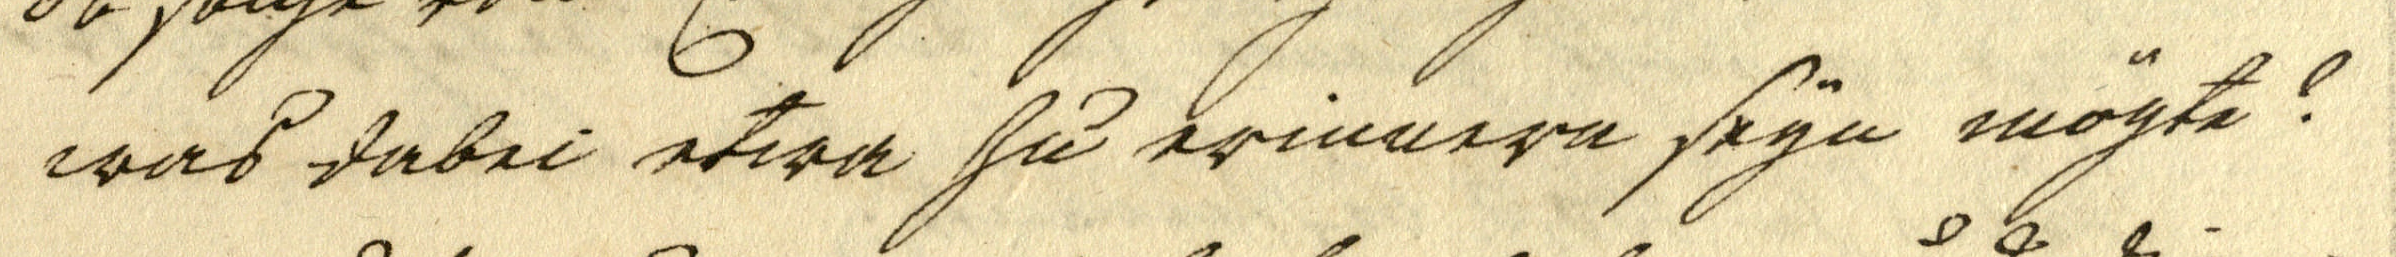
was dabei etwa zu erinnnern seyn mögte?
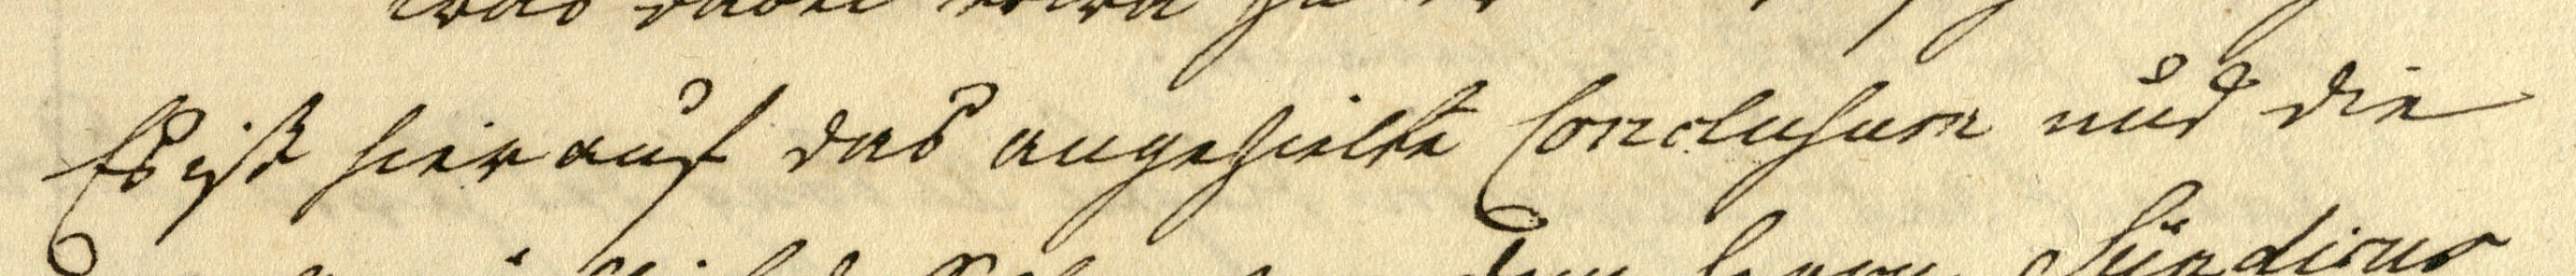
Es ist hierauf das angezielte Conclusum und die
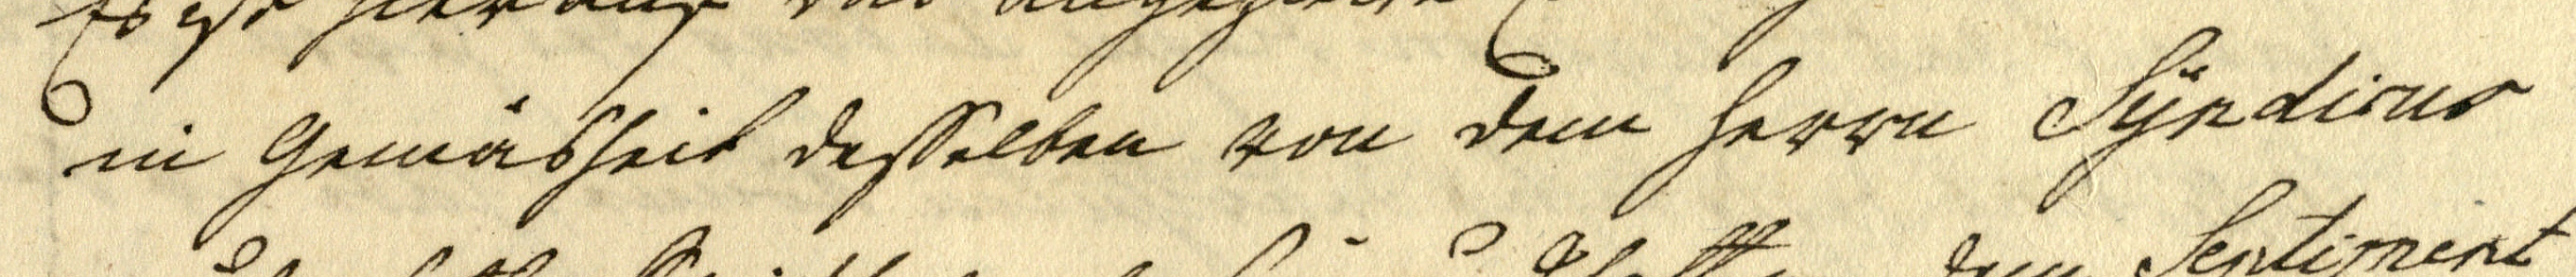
in Gemäsheit desselben von dem herrn Syndicus
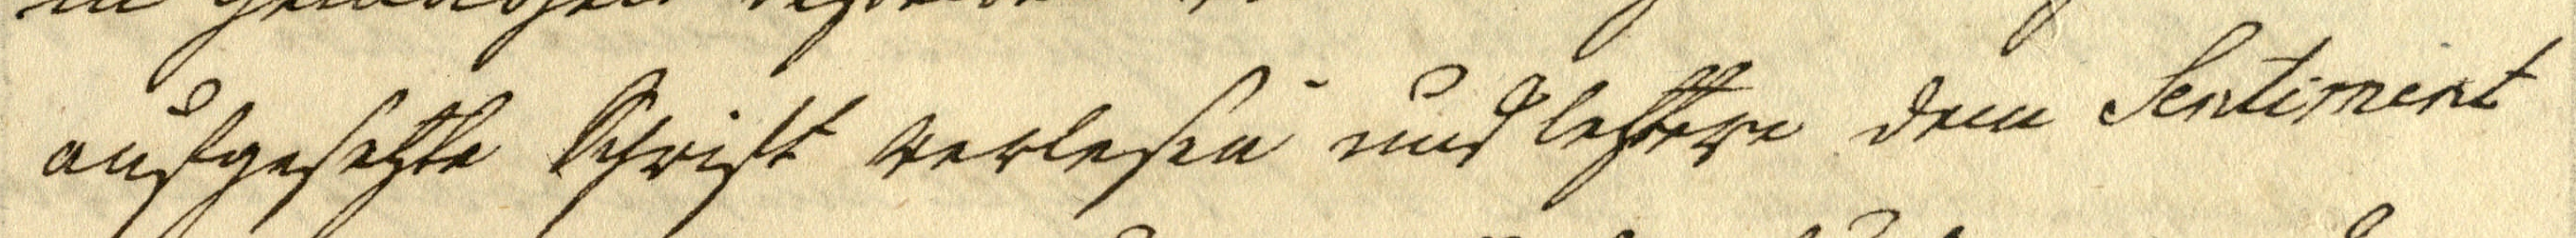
aufgesetzte Schrift verlesen und letztere dem Sentiment
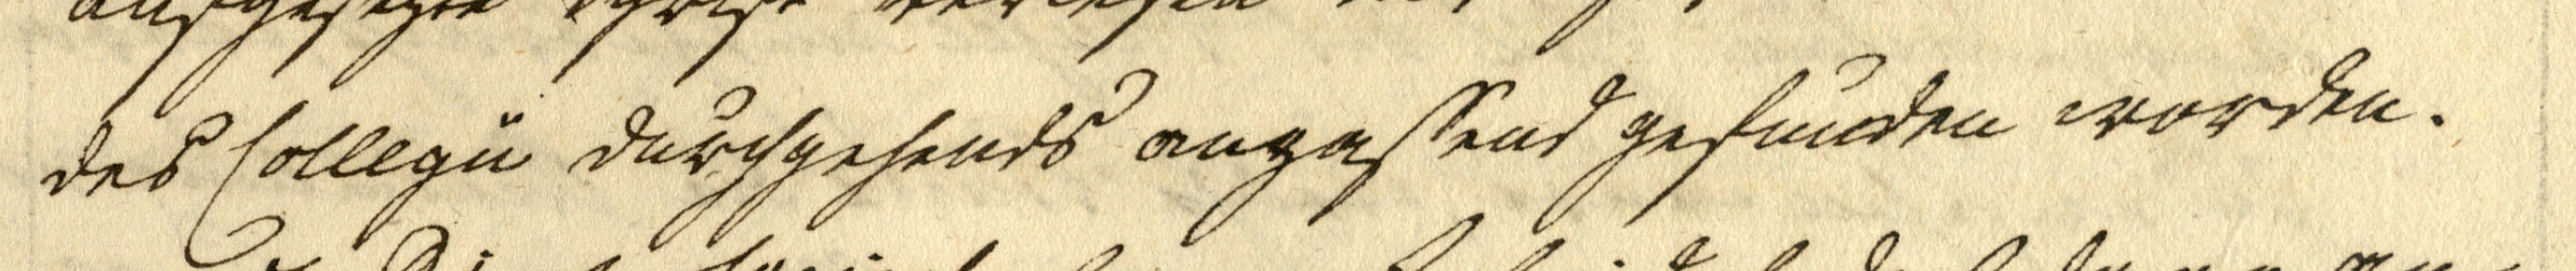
des Collegii durchgehends anpassend gefunden worden.
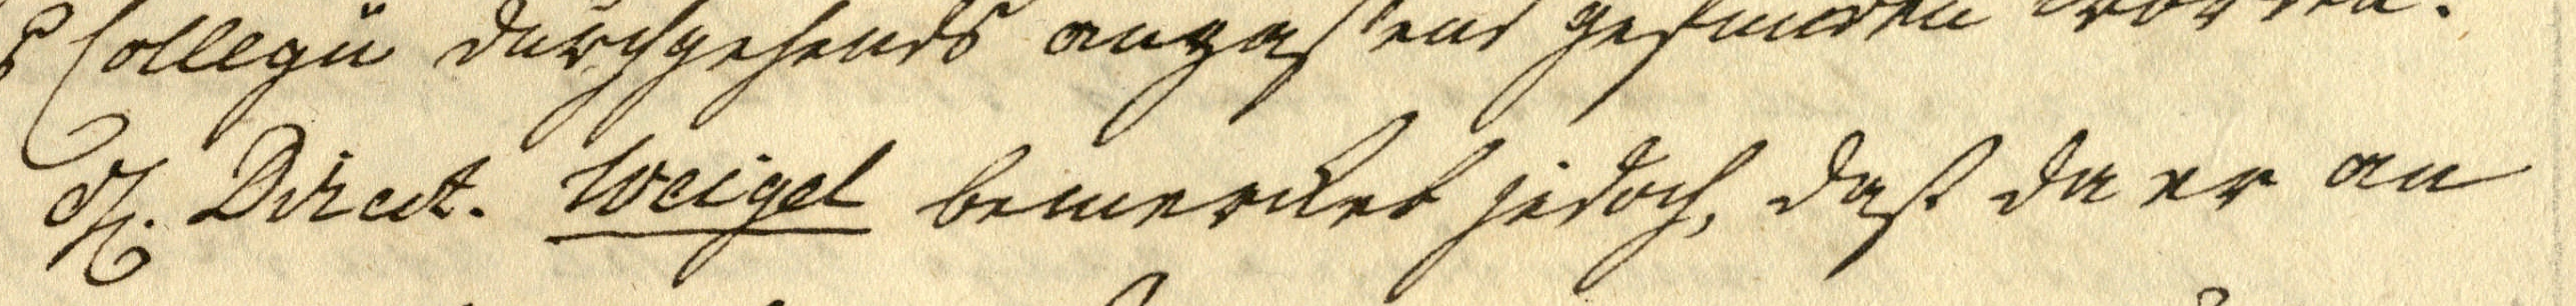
dh. Direct. Weigel bemerket jedoch, daß da er an
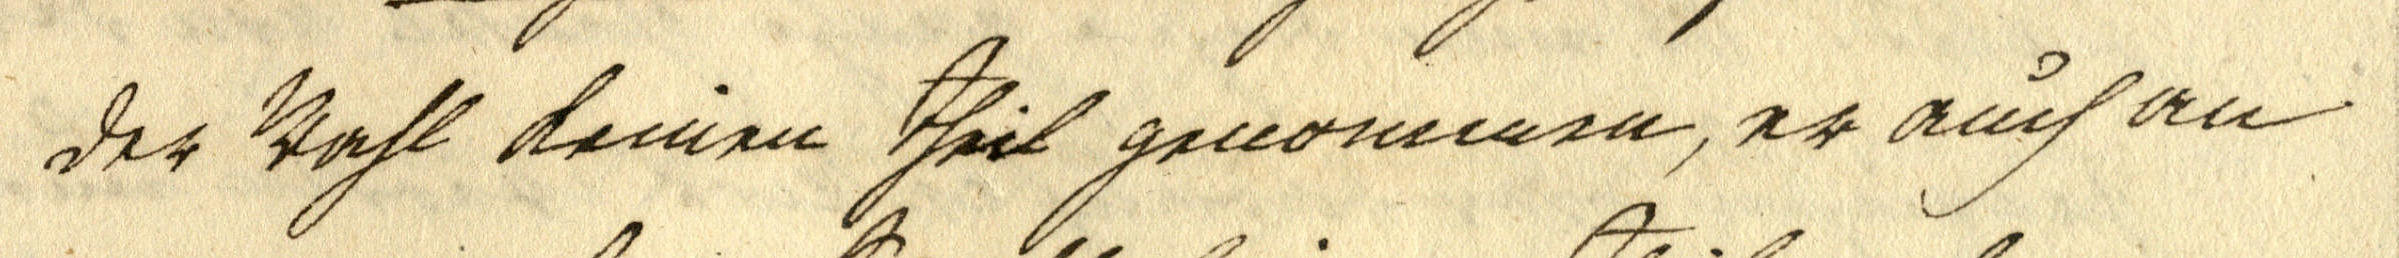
der Wahl keinen Theil genommen, er auch an
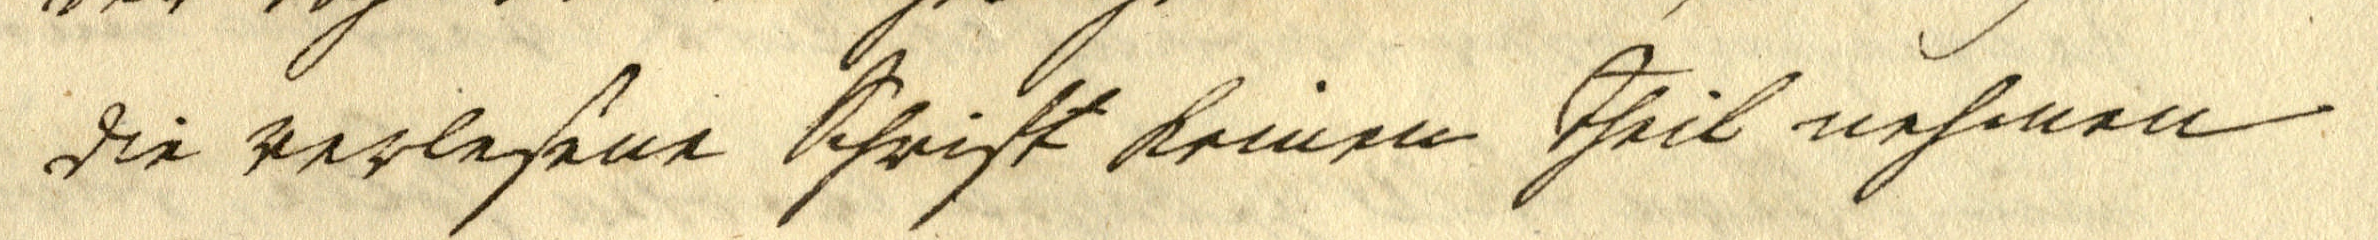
die verlesene Schrift keinen Theilnehmen
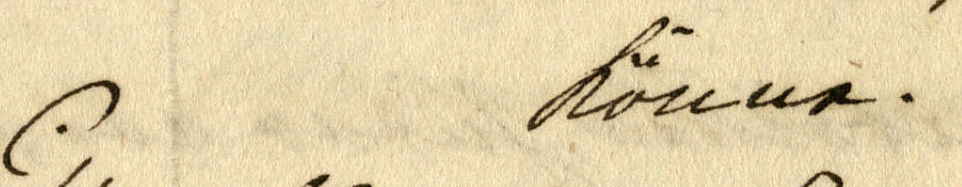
könne.
